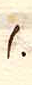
1.
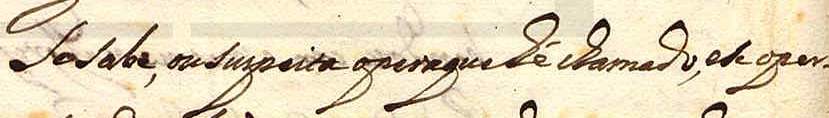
Se sabe, ou suspeita o pera que hé chamado, e se o per
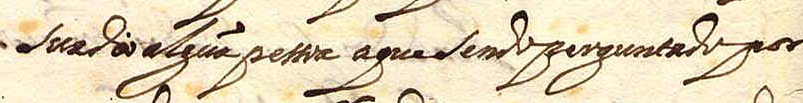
suadio alguā pessoa a que sendo perguntado por
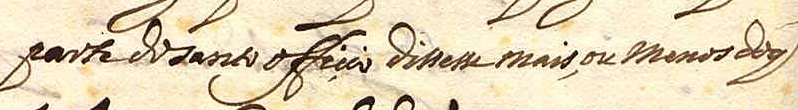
parte do santo officio dissesse mais, ou menos do q̄
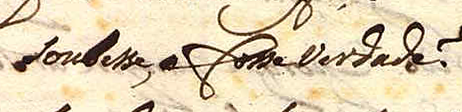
soubesse, e fosse verdade?
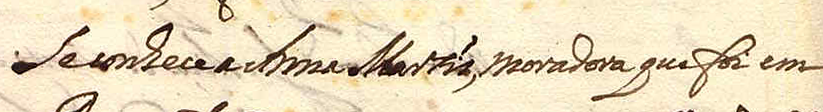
Se conhece a Anna Martīs, moradora que foi em
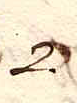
2.
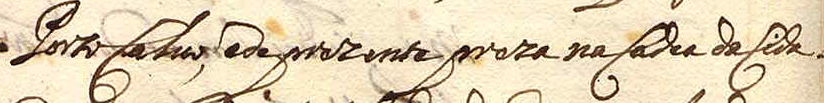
Porto Caluo, e de prezente preza na Cadea da Cida
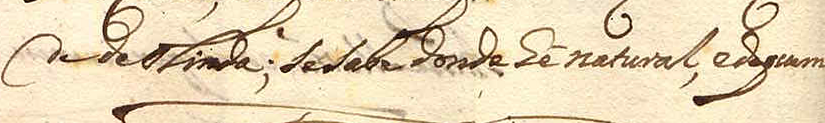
de de olinda; se sabe donde hé natural, e de quem
